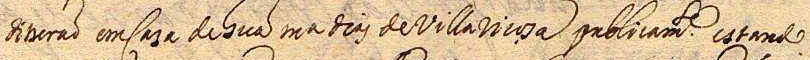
disserão em Caza de huā ma dias de Villa viçosa publicamte. estando
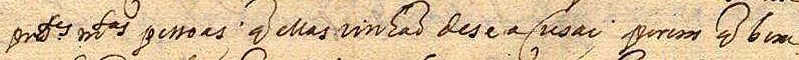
prestes. mtas pessoas; q̄ ellas vinhão de se aCusar; porem q̄ bem
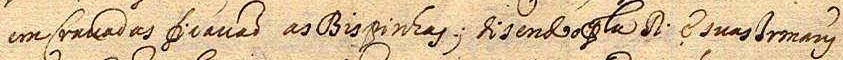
emCrauadas ficauão as Bispinhas; disendoo p̄la R e suas Irmans̄
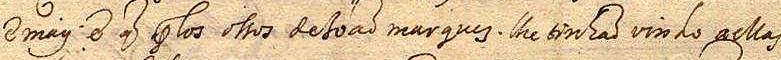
e may: e q̄ p̄los ossos de Ioão marquez. lhe tinhão vindo a ellas
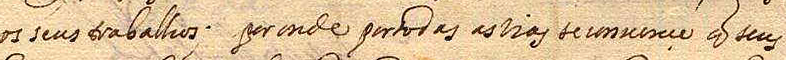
os seus trabalhos; por onde por todas as vias se conuençe q̄ seus
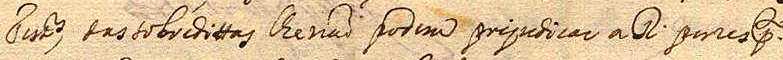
Testos, das sobredittas lhe não podem prejudicar a R por respto.
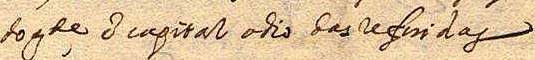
do gde, e capital odio das referidas
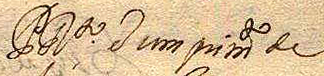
P Rto., e comprimto de
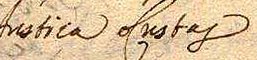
Iustiça e Custas
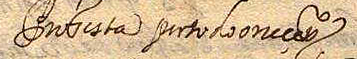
ProTesta por todo o neçesro
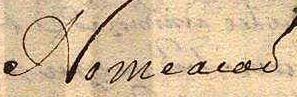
Nomeacaõ
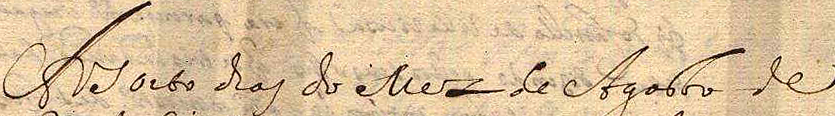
Aos oito dias do Mez de Agosto de
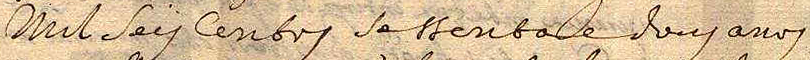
mil SeisCentos sessenta e dous anos
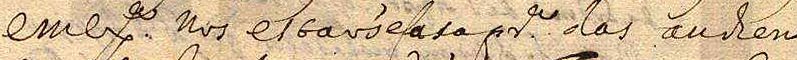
em lixa. nos estaos e Casa pr.a das audien
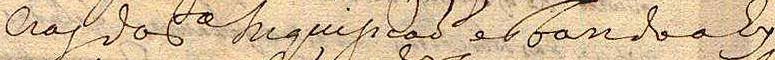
cias da sta Inquisicaõ estando ahy
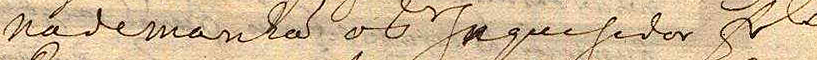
na de manhā o sor Jnquisidor frCo
